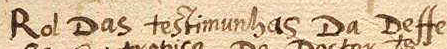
Rol Das testimunhas Da Deffe
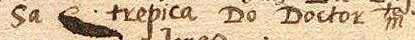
sa e trepica Do Doctor mte
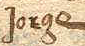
Jorge
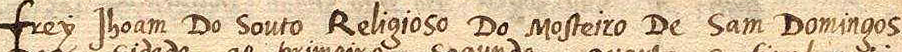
frey Jhoam Do Souto Religioso Do Mosteiro De Sam Domingos
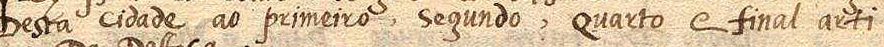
Desta cidade ao primeiro, segundo, Quarto e final arti
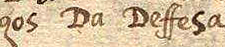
gos Da Deffesa.
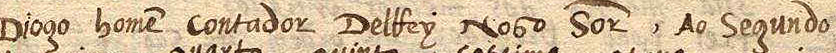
Diogo home̅ contador Del Rey Noso S̅or, Ao Segundo
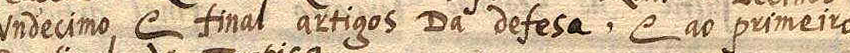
Vndecimo e final artigos Da defesa, e ao primeiro
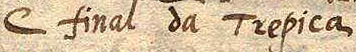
e final da Trepica
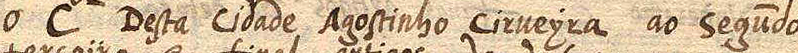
o Cor Desta Cidade Agostinho Cirueyra ao Segu̅do
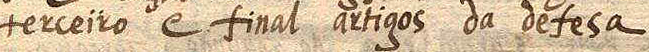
terceiro e final artigos da defesa
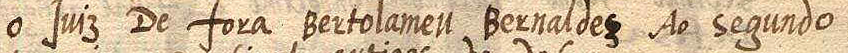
o Juiz De fora Bertolameu Bernaldez Ao segundo
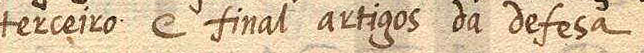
terceiro, e final artigos da defesa
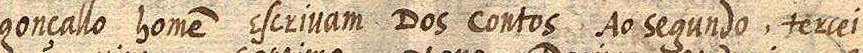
gonçallo home̅ Escriuam Dos contos Ao segundo, tercei
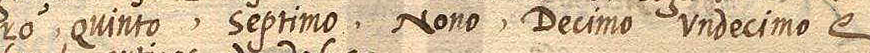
ro, Quinto, Septimo, Nono, Decimo Vndecimo e
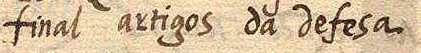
final artigos da defesa
